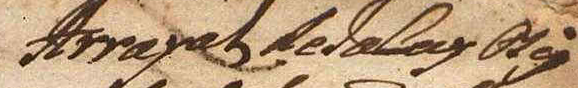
Arrayal de IaCuy Bis
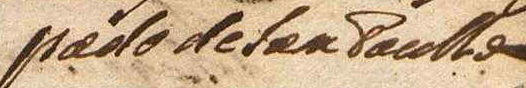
pado de Sam Paullo
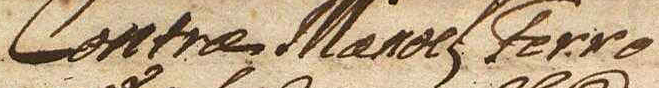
Contra Manoel Ferro
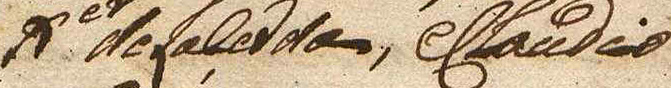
Xer de LaÇerda, e Claudio
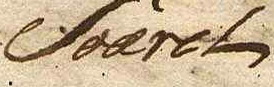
Soares
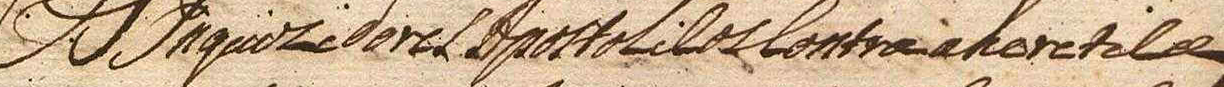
OS Inquizidores ApostoLiCos Contra a heretiCa
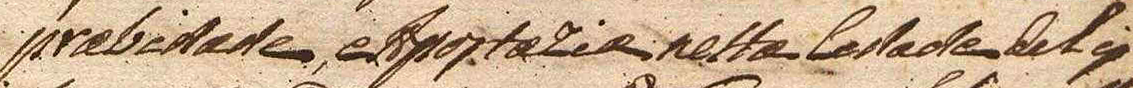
pravidade, e Apostazia nesta Cidade de Lis
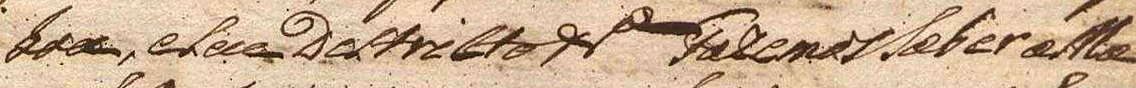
boa, e seu DestriCto &a Fazemos Saber a Ma
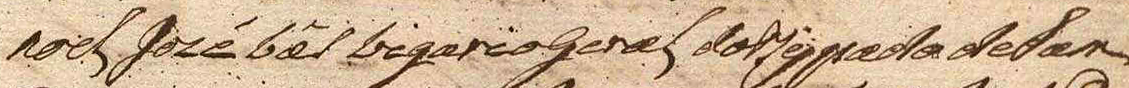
noe Jozé Vás Vigario Geral, do Bispado de Sam
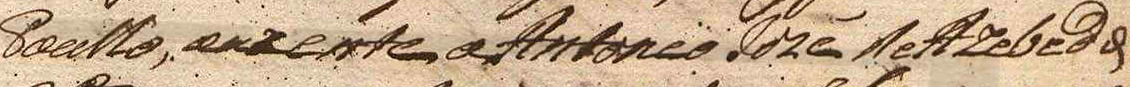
Paullo, auzente a Antonio Iozé de Azevedo
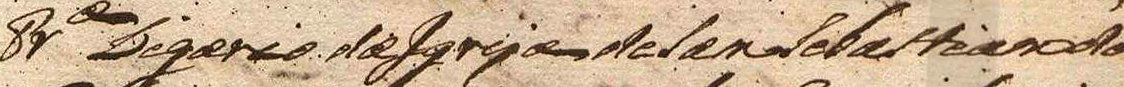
Pr.a Vigario da Igreja de Sam Sebastiam do
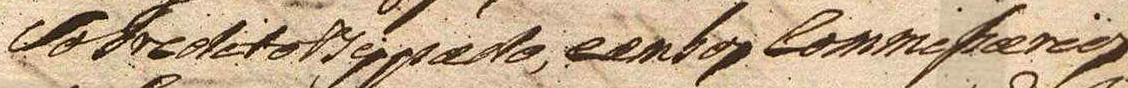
Sobredito Bispado, e ambos Commissarios
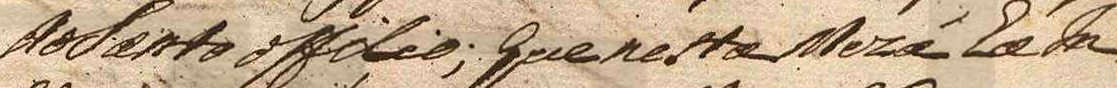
do Santo offiÇio, Que nesta Meza ha In
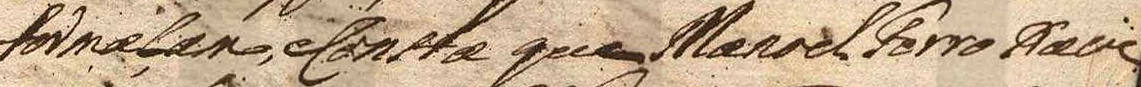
formaÇam, e Consta que Manoel Ferro Xavi
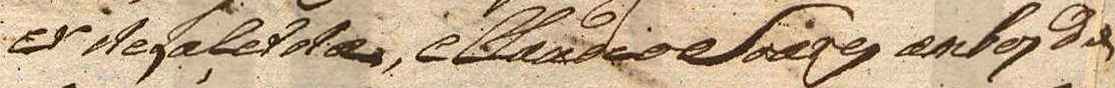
er de LaÇerda, e Claudio Soares ambos do
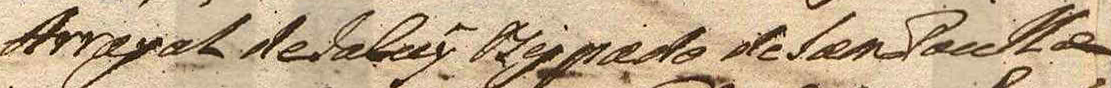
Arrayal de IaCuŷ Bispado de Sam Paullo
